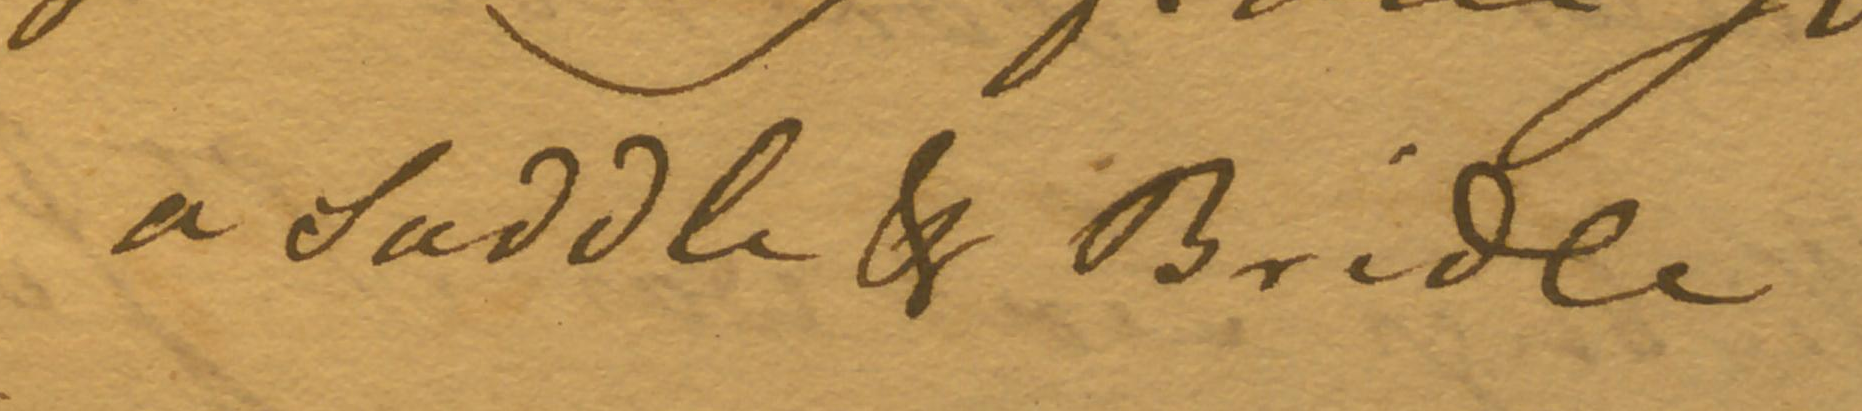a Saddle & Bridle
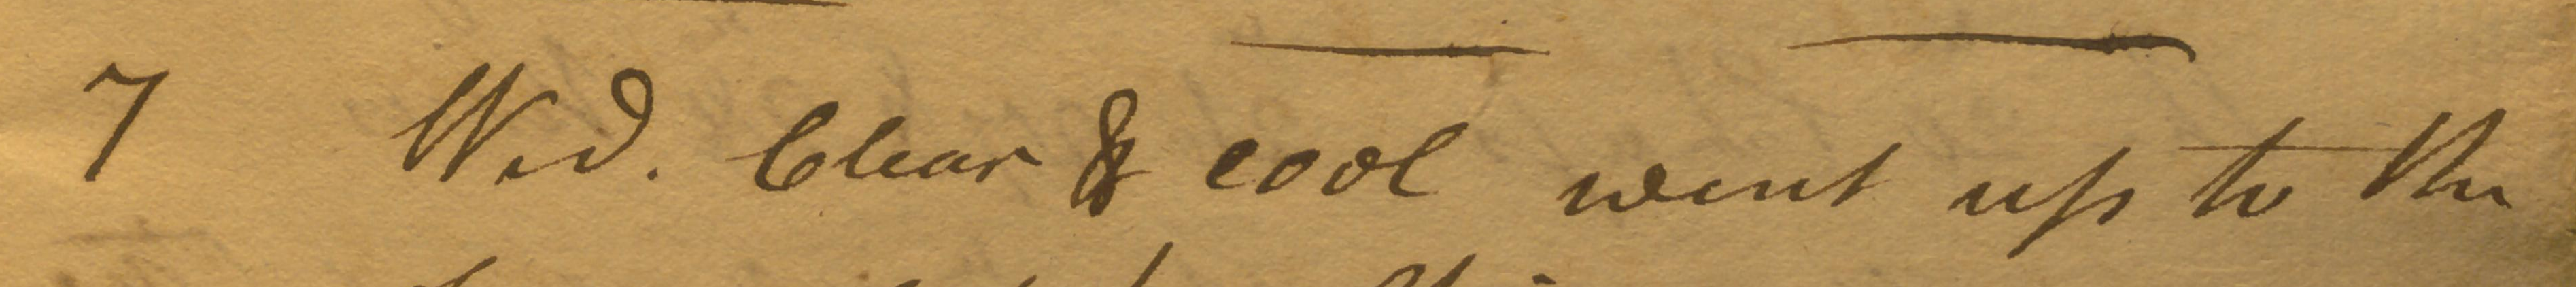7 Wed. Clear & cool went up to the
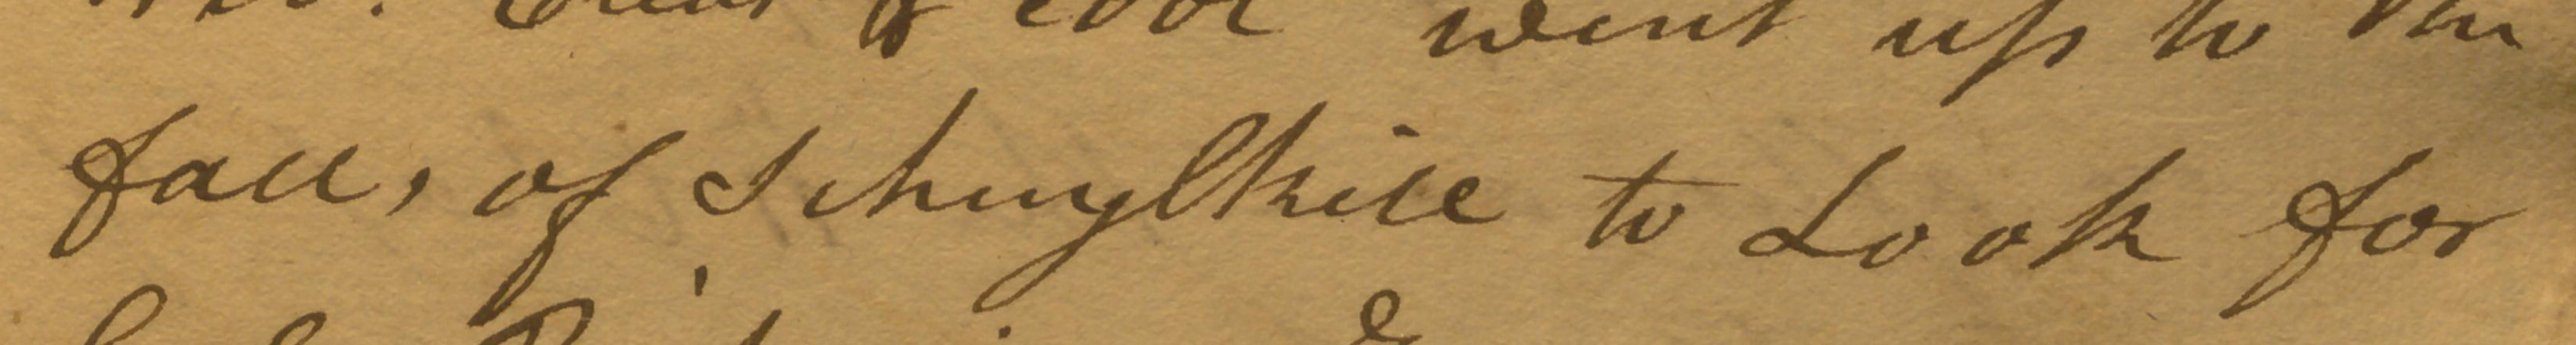falls of Schuylkill to Look for
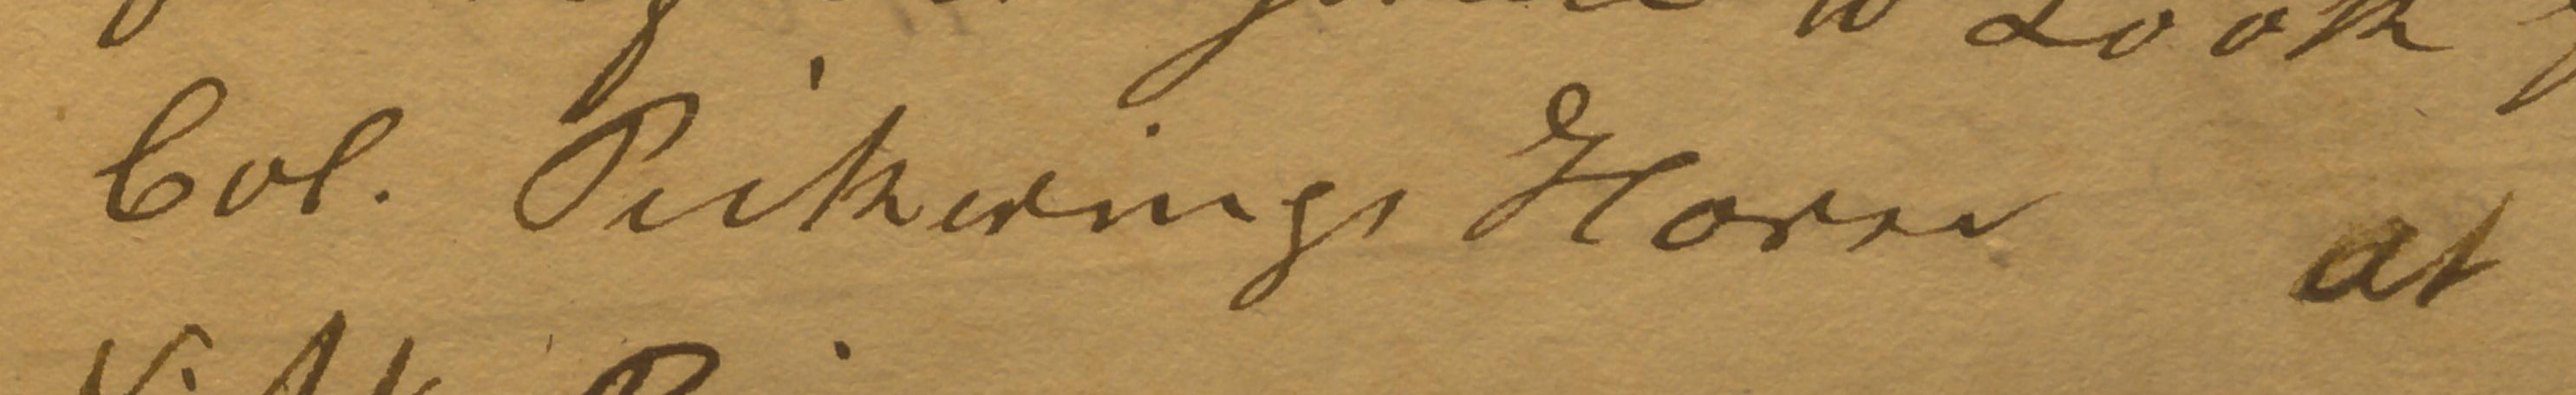Col. Pickerigs Horse at
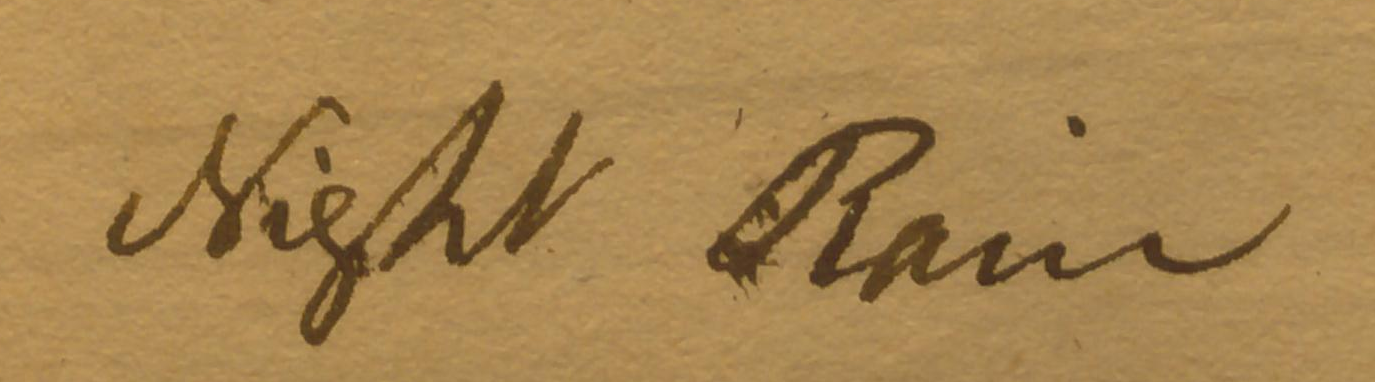Night Rain
